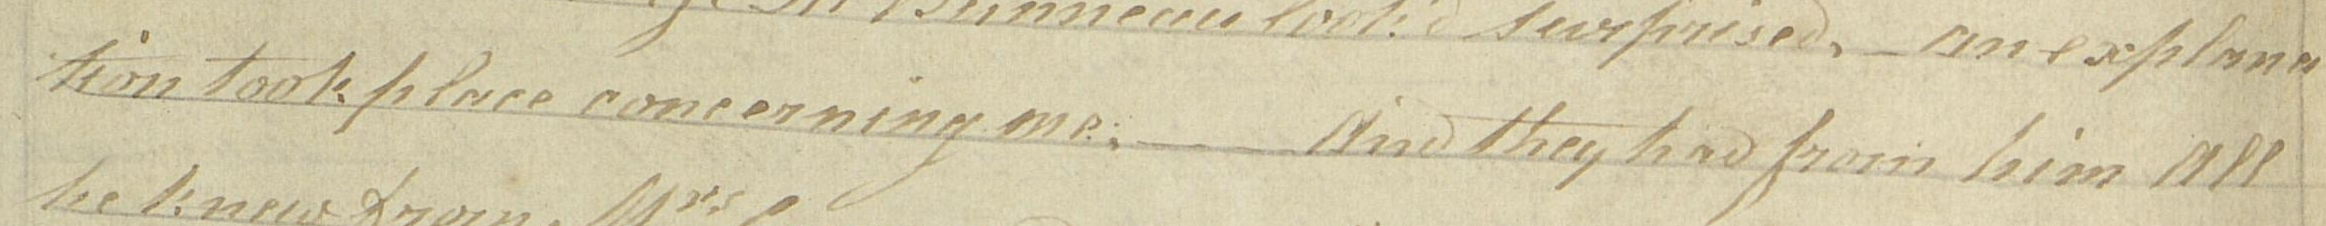-tion took place concerning me. And they had from him all
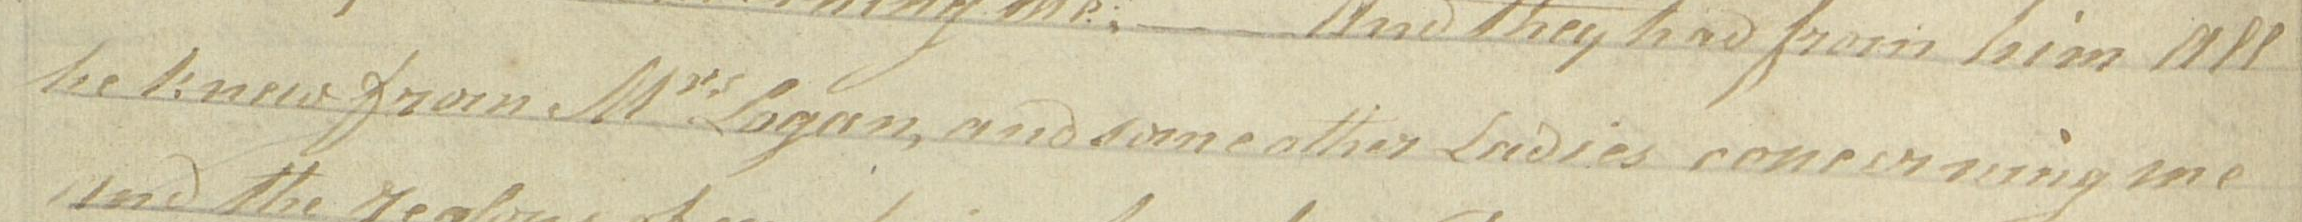he knew from M^rs. Logan, and some other Ladies concerning me
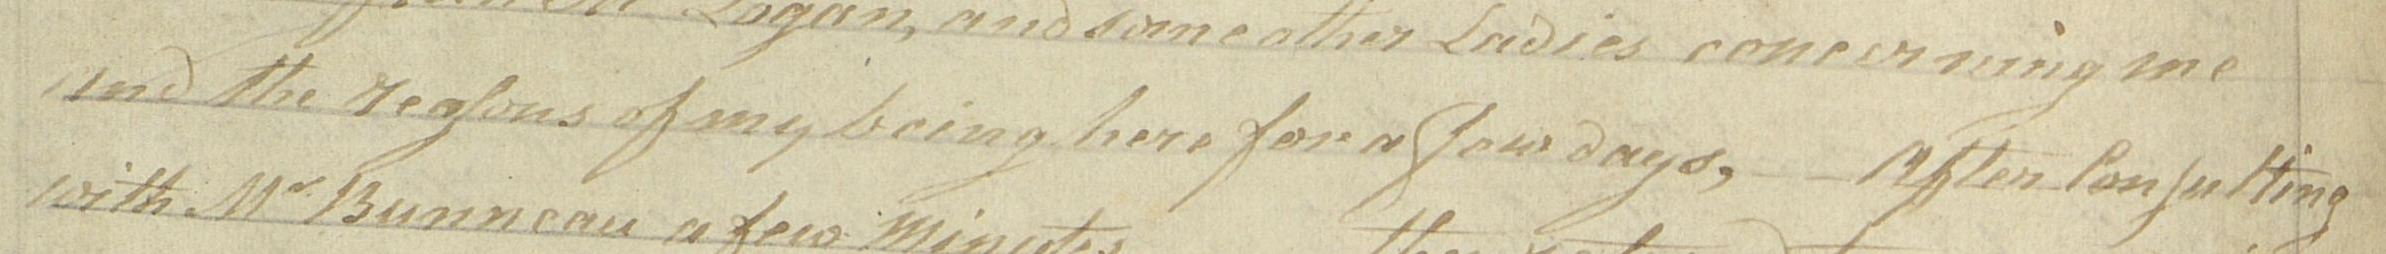And the reasons of my being here for a few days, After Consulting
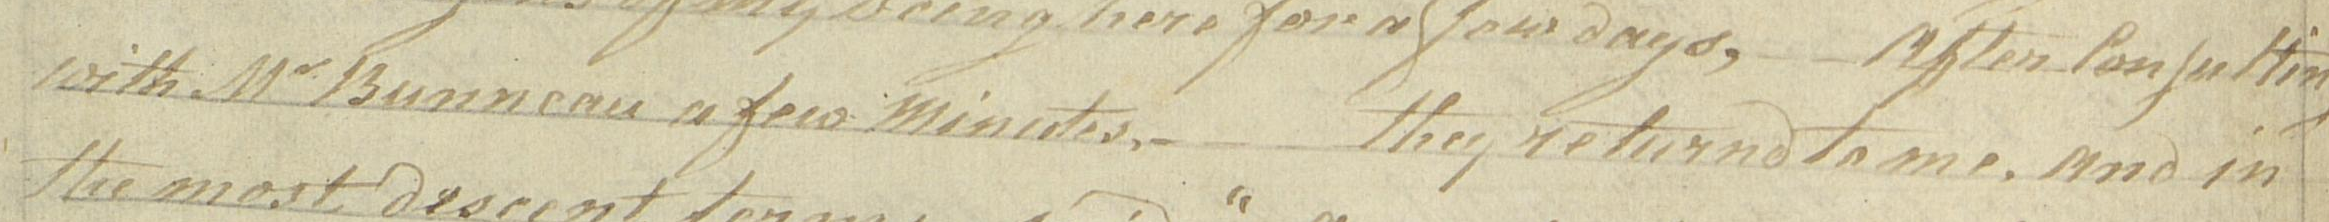with M^r Bunneau a few Minutes, they returnd to me, And in
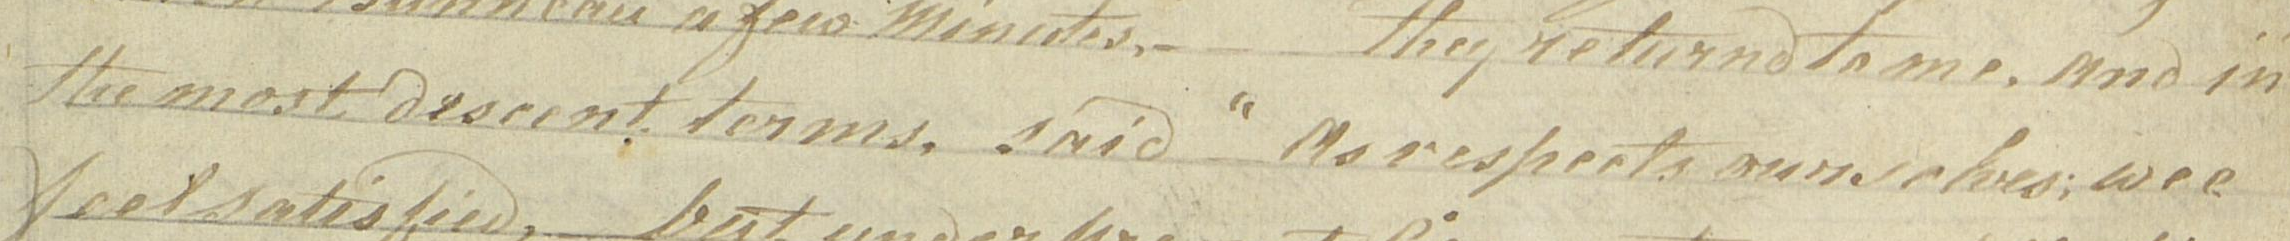the most descent terms, said "As respects ourselves; wee
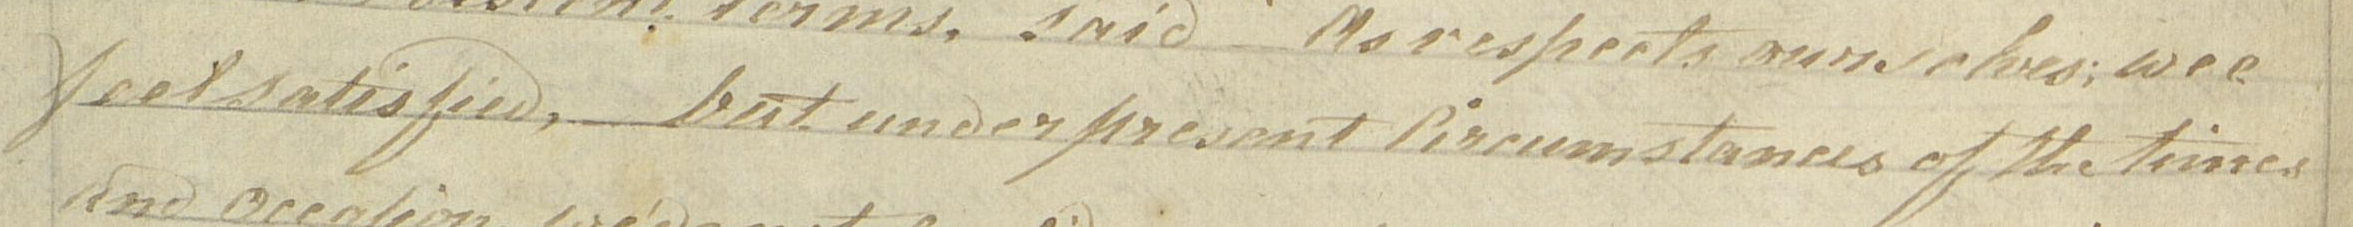feel satisfied, but under present Circumstances of the times
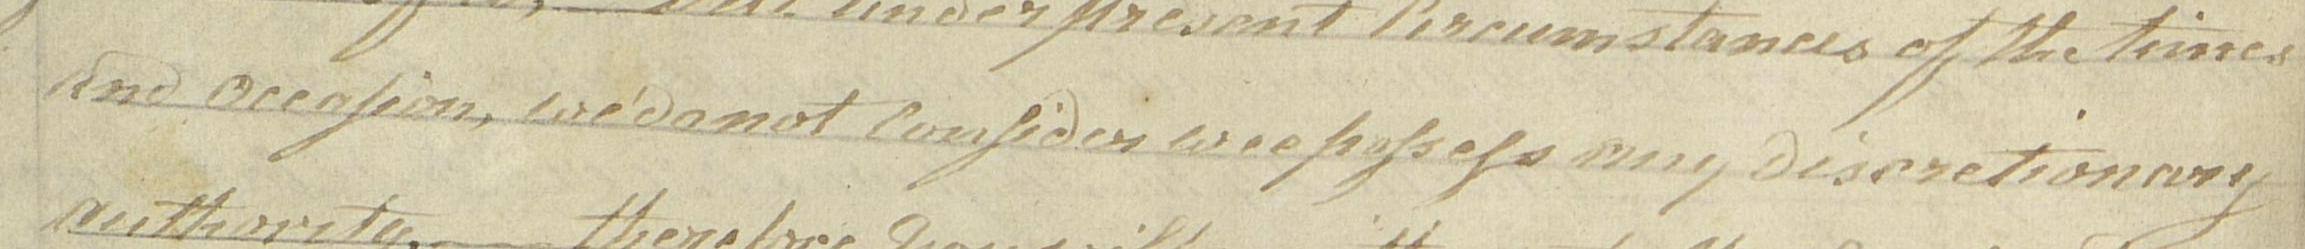and Occasion, we do not Consider wee possess any discretionary
